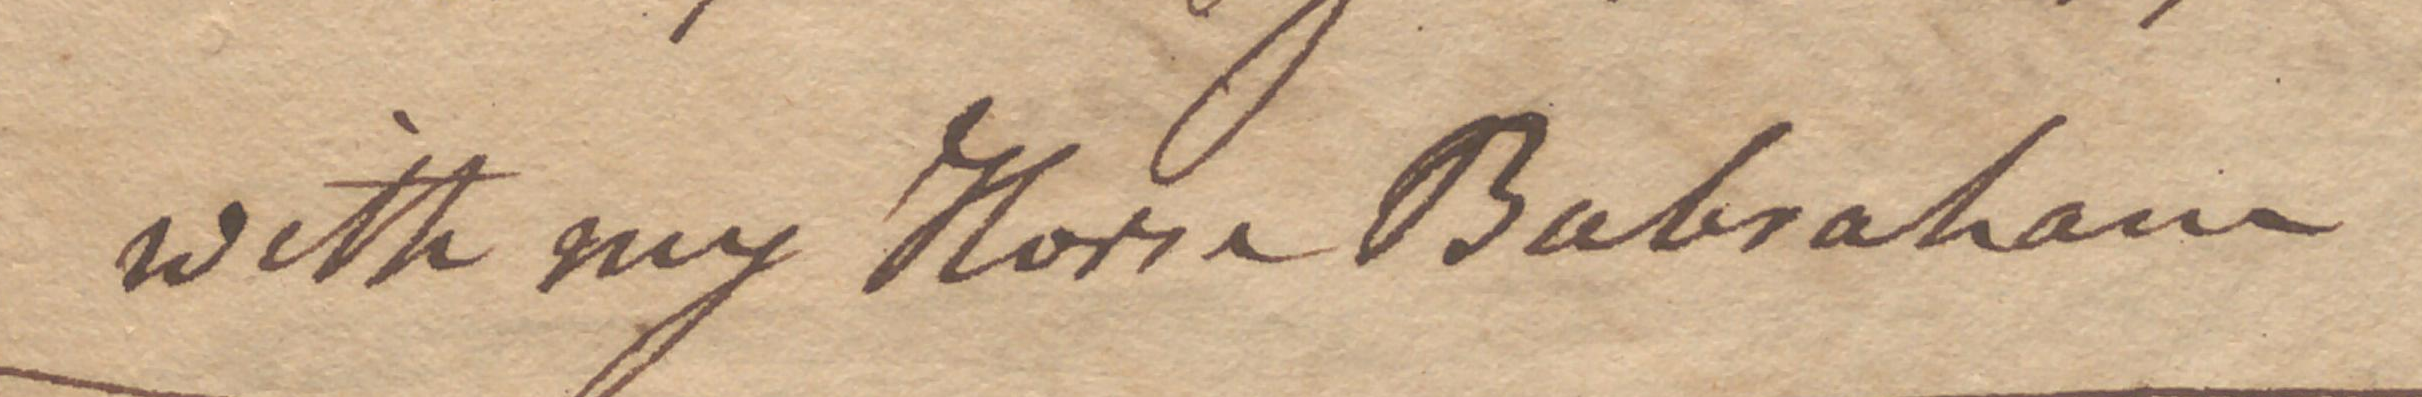with my Horse Babraham
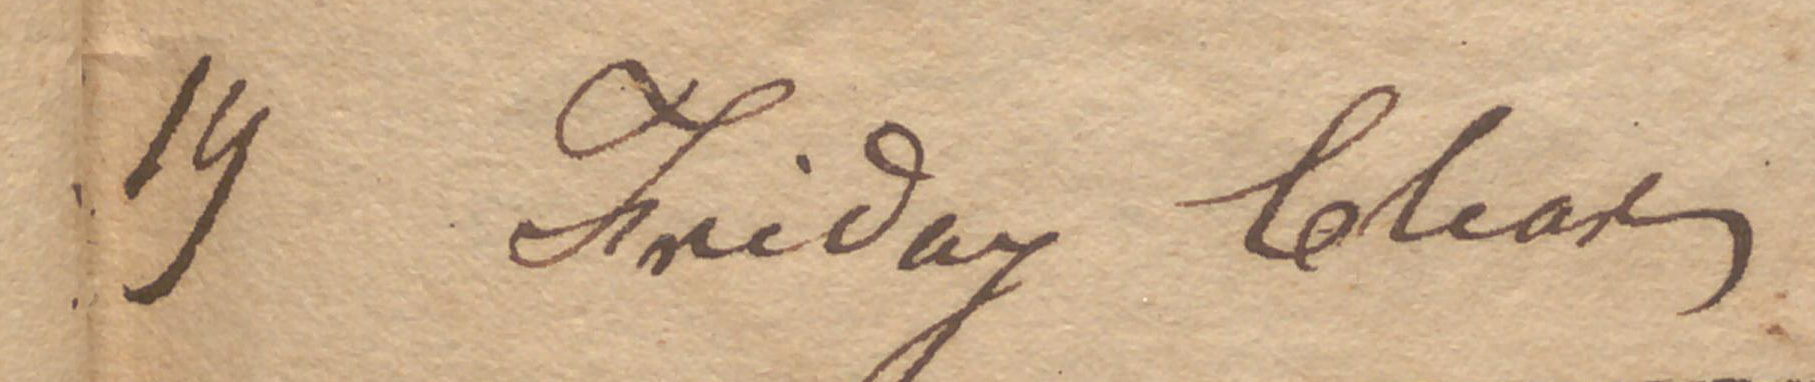19 Friday Clear
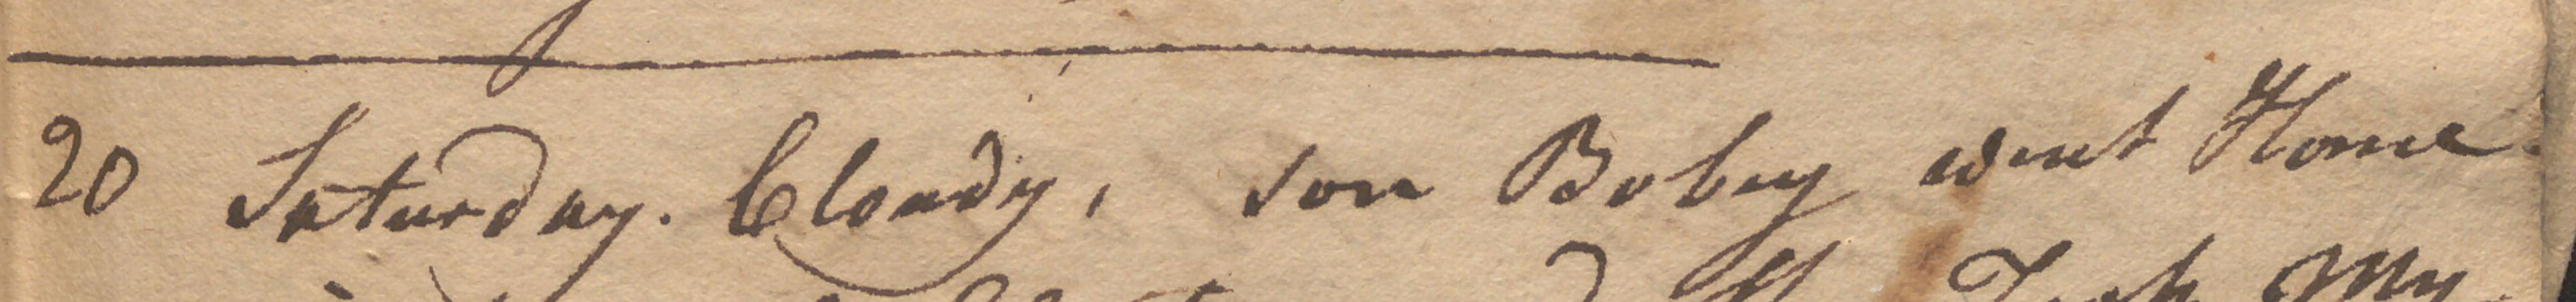20 Saturday. Cloudy, son Bobey went Home
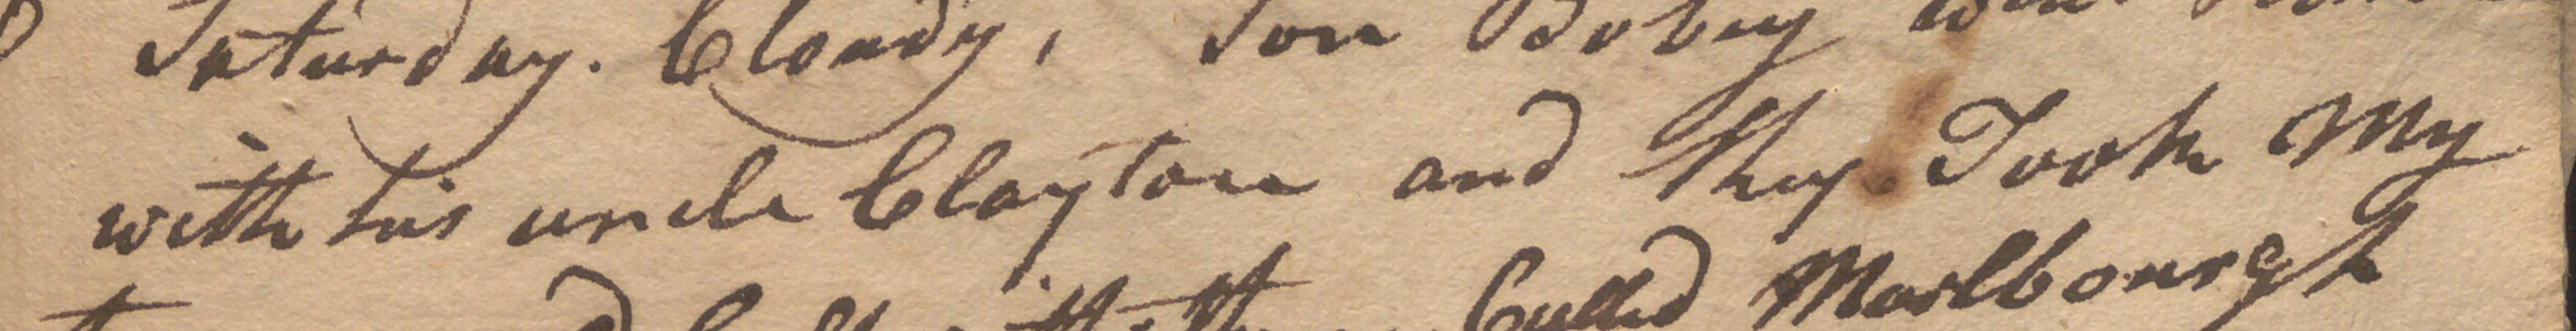with his uncle Clayton and they Took My
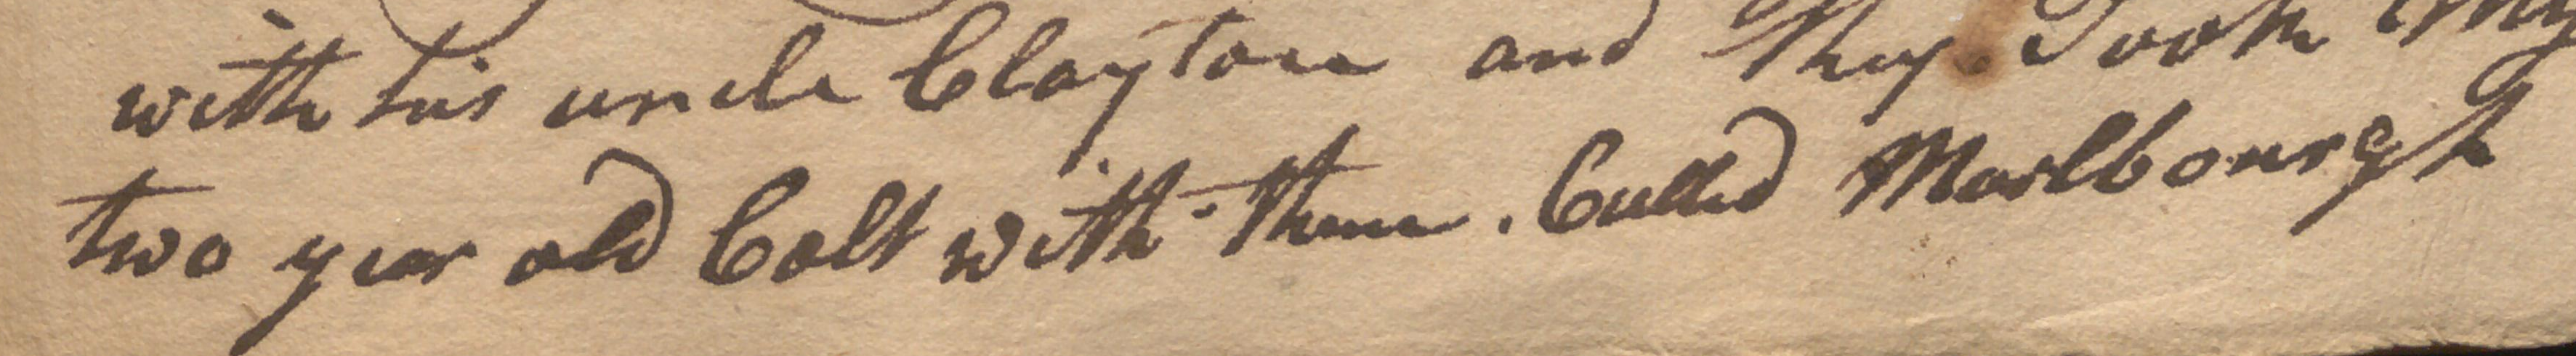two year old Colt with them. Culled Marlbourgh
